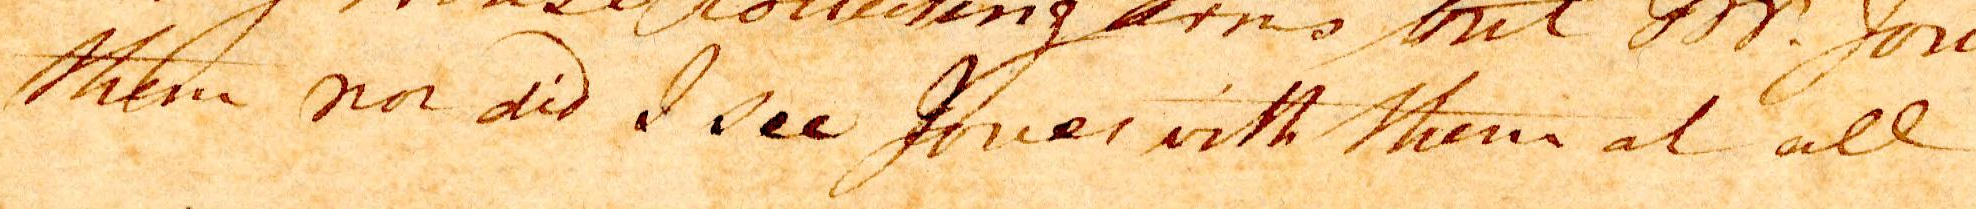them nor did I see Jones with them at all
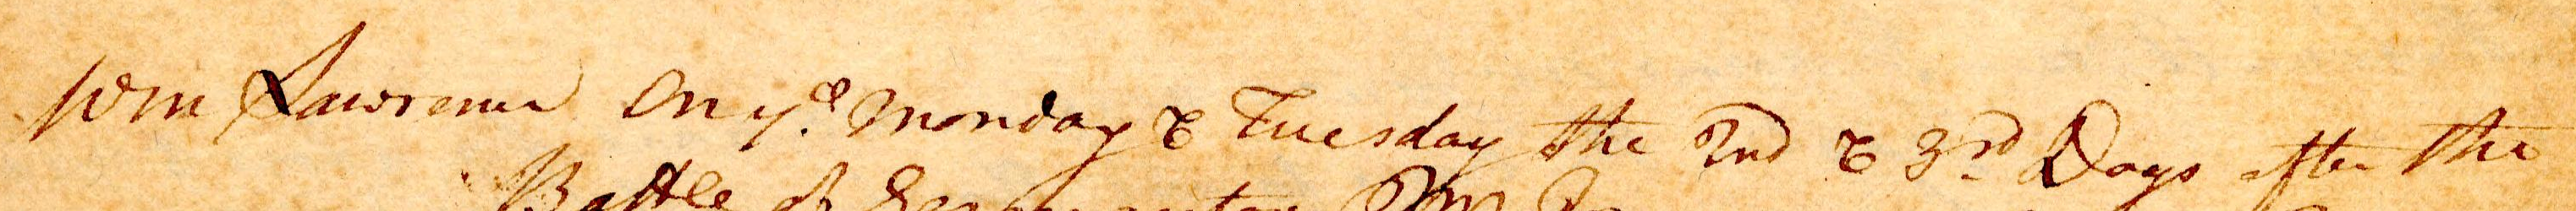W^m Sasrem On y^e Monday & Tuesday the 2nd & 3^rd Days after the
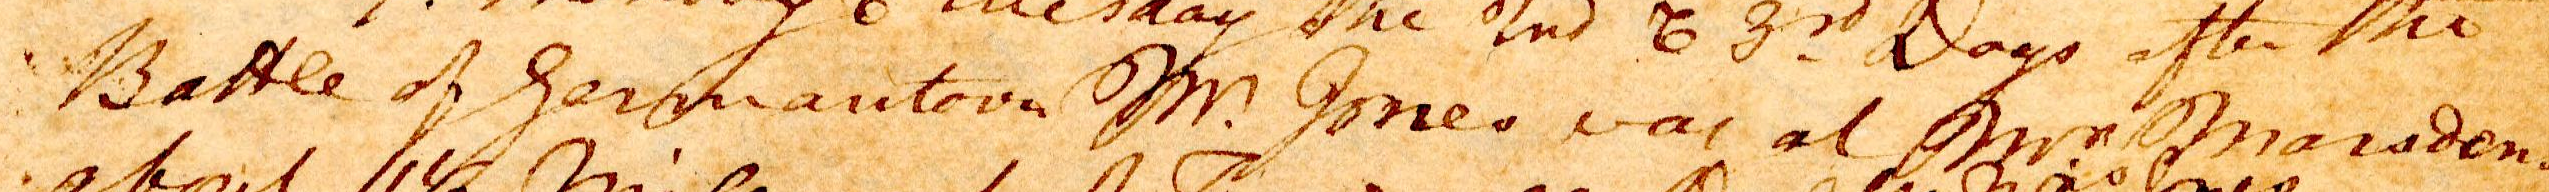Battle of Germantown M^r. Jones was at M^r Marsden's
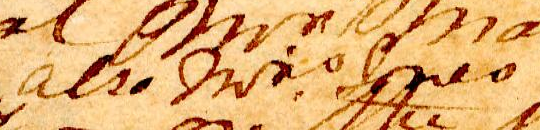also M^r. Jones
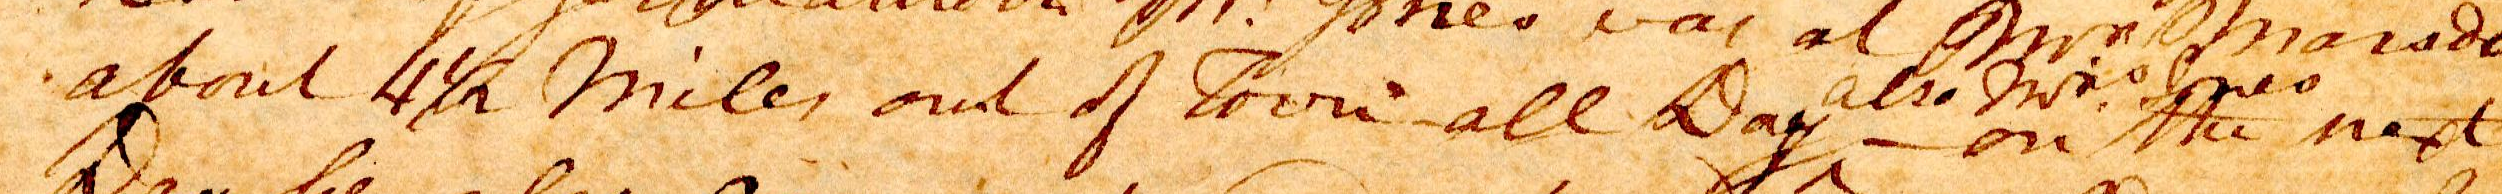about 4 1/2 Miles out of Town all day- on the next
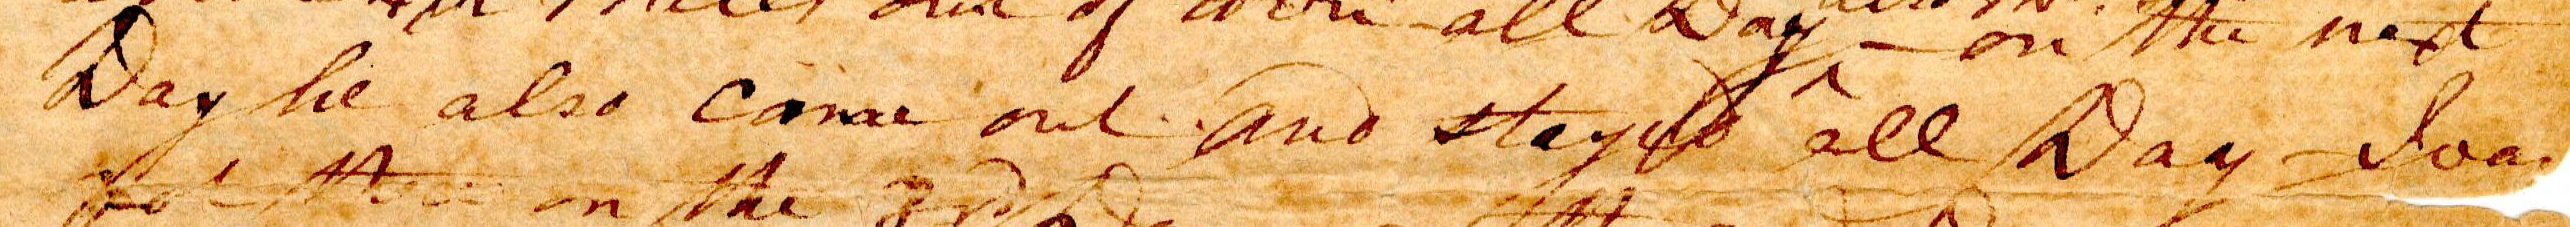Day he also came out and stayed^ all Day. I was
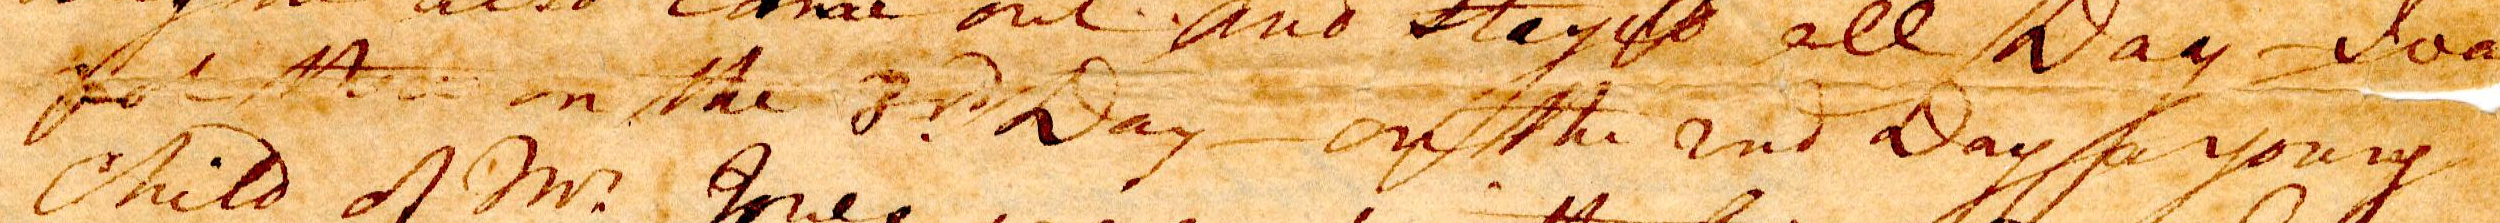not there on the 3^rd Day- on the 2nd Day a young
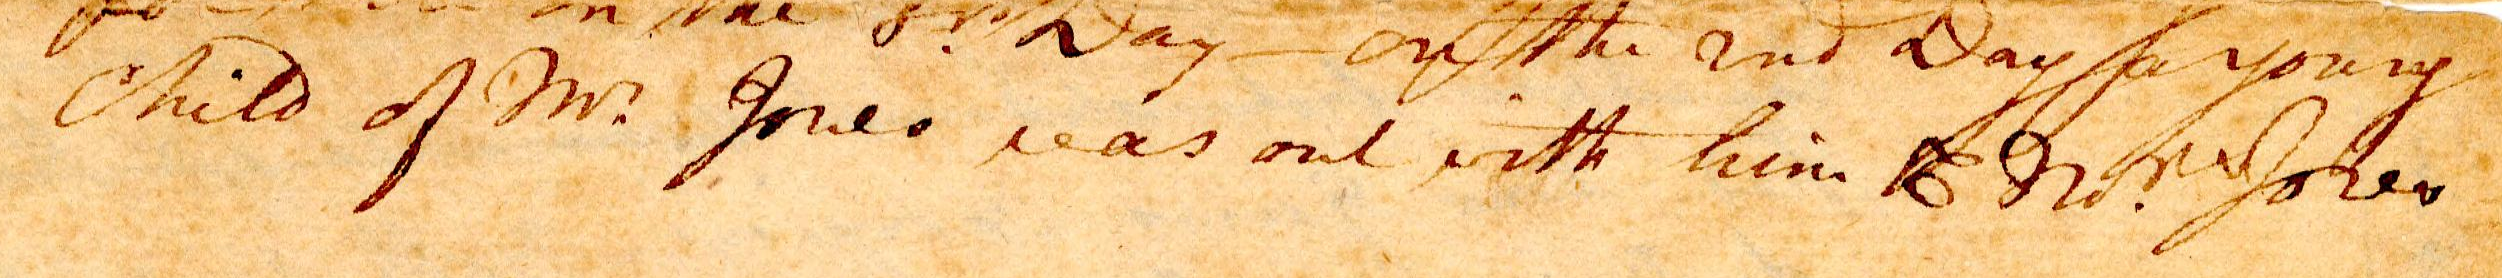Child of M^r. Jones was out with him & M^s. Jones
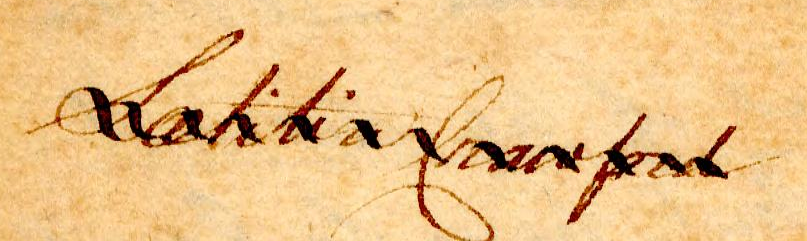[Latita Crawford]
